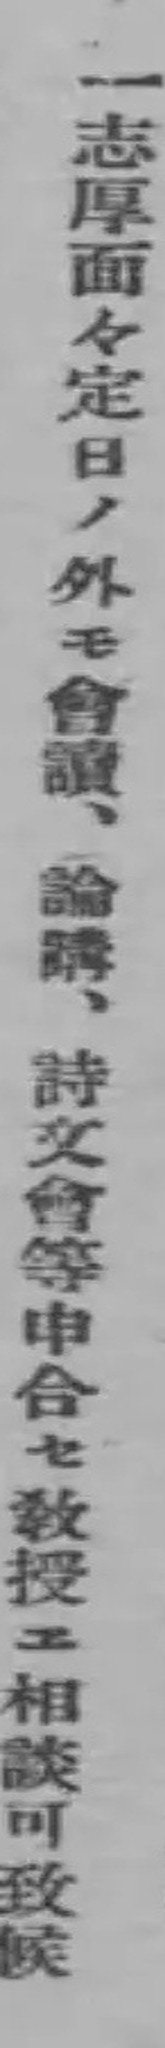一志厚面々定日ノ外モ会読、論講、詩文会等申合セ教授エ相談可致候
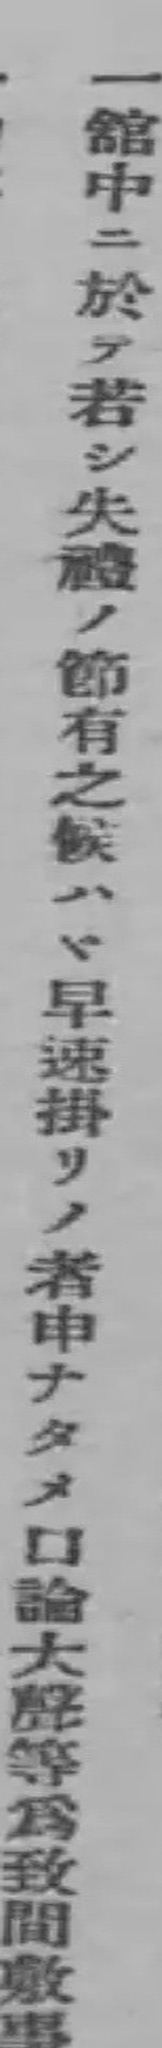一館中ニ於テ若シ失礼ノ節有之節ハヾ早速掛リノ者申ナタメ口論大声等為致間敷事
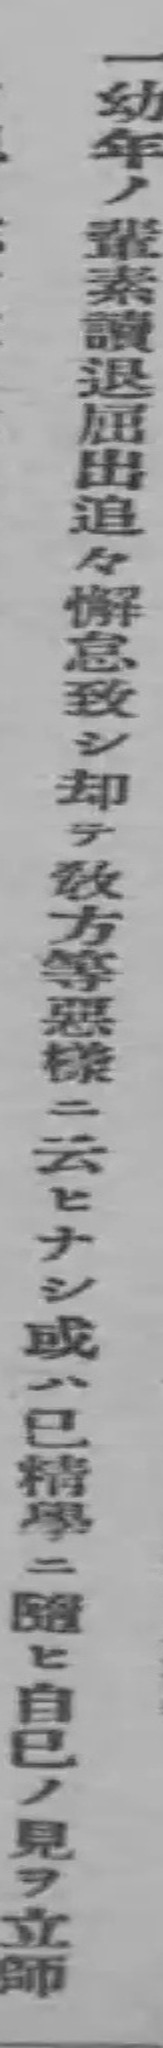一幼年ノ輩素読退屈出追々懈怠致シ却テ教方等悪様ニ云ヒナシ或ハ己精学ニ随ヒ自己ノ見ヲ立師
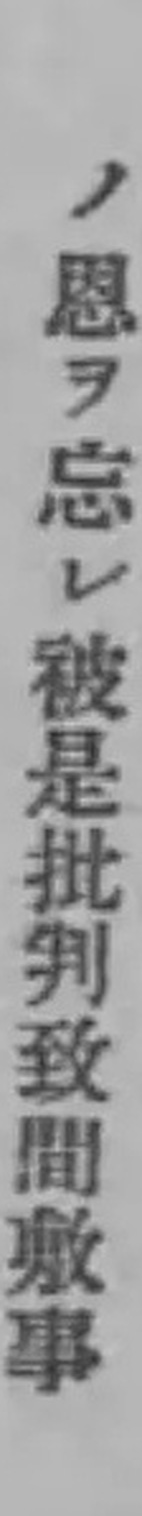ノ恩ヲ忘レ被是批判致間敷事
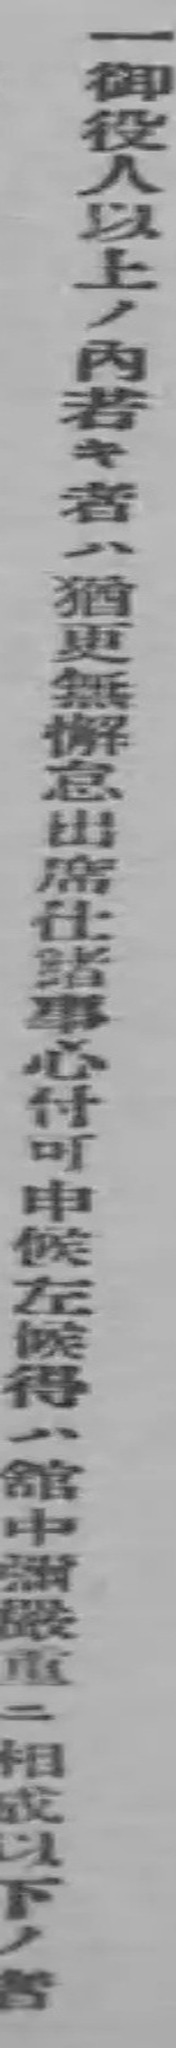一御役人以上ノ内若キ者ハ猶更無懈怠出席仕諸事心付可申候左候得ハ館中弥厳重ニ相成以下ノ者
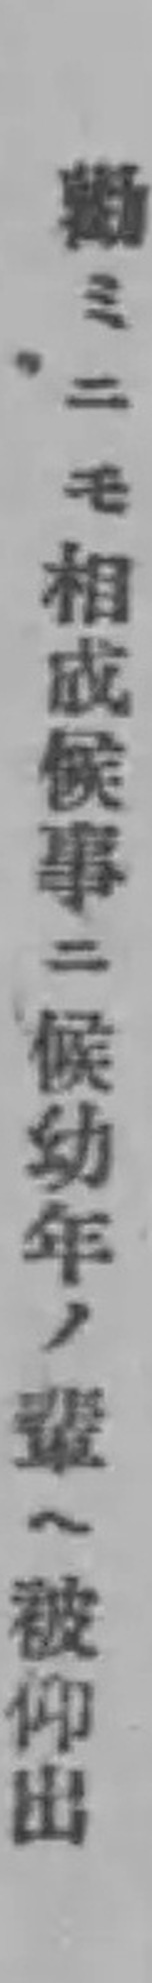励ミニモ相成候事ニ候幼年ノ輩ヘ被仰出
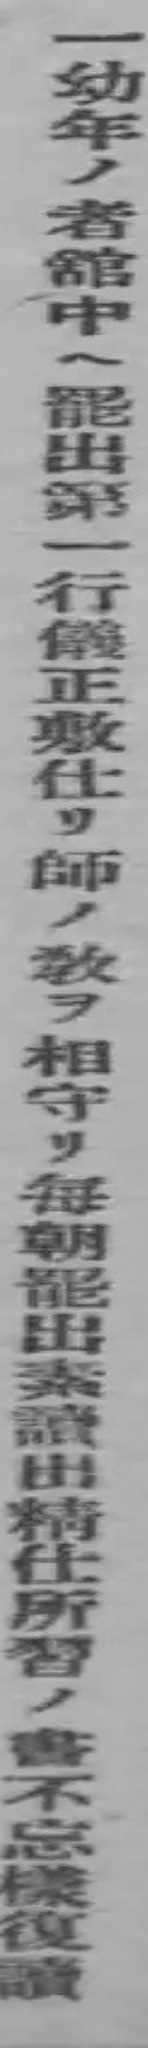一幼年ノ者館中ヘ罷出第一行儀正敷仕リ師ノ教ヲ相守リ毎朝罷出素読出精仕所習ノ書不忘様復読
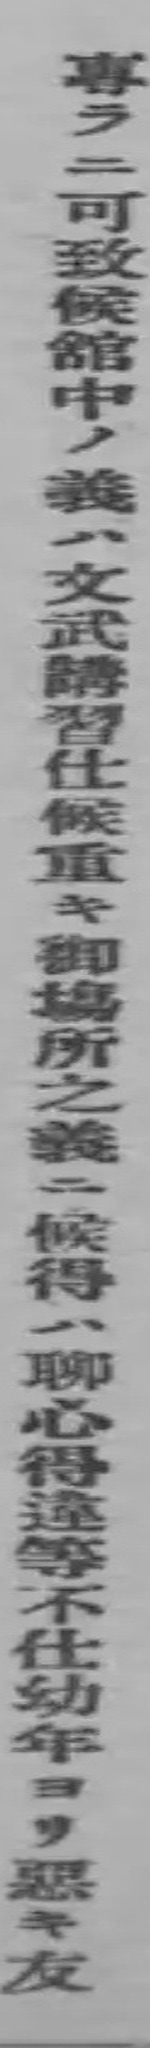専ラニ可致候館中ノ義ハ文武講習仕候重キ御場所之義ニ候得ハ聊心得違等不仕幼年ヨリ悪キ友
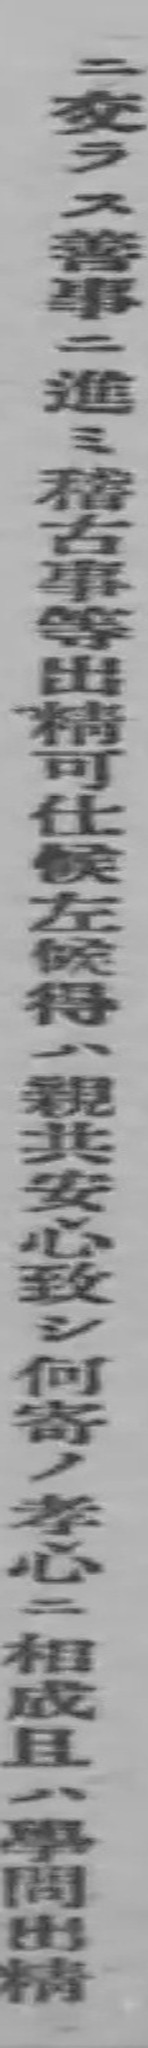ニ交ラス善事ニ進ミ稽古事等出精可仕候左候得ハ親共安心致シ何寄ノ孝心ニ相成且ハ学問出精
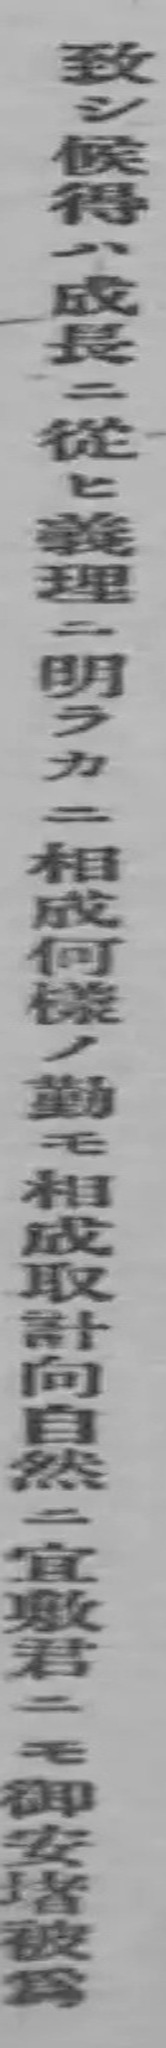致シ候得ハ成長ニ従ヒ義理ニ明ラカニ相成何様ノ勤モ相成取計向自然ニ宜敷君ニモ御安堵被為
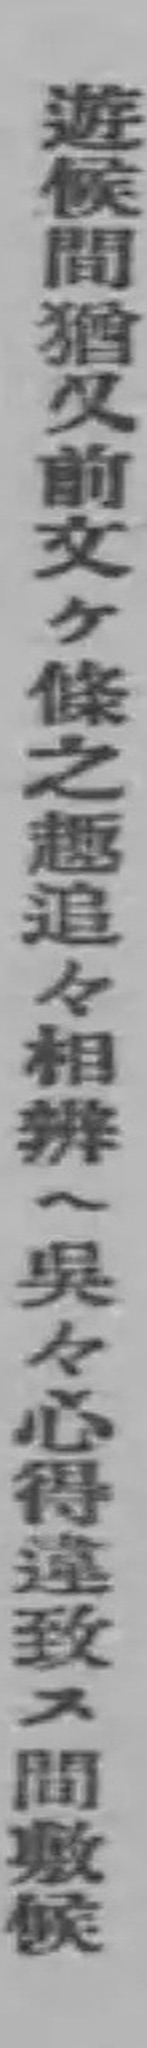遊候間猶又前文ケ條之趣追々相弁ヘ呉々心得違致ス間敷候
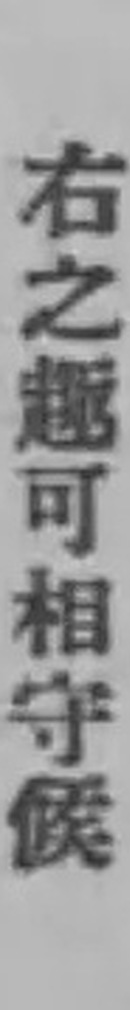右之趣可相守候
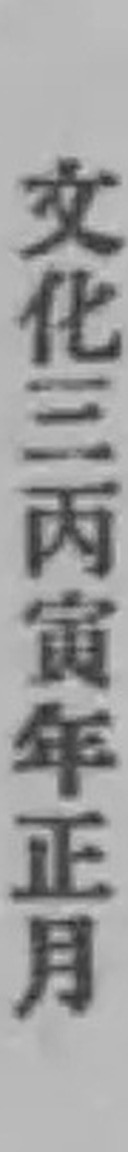文化三丙寅年五月
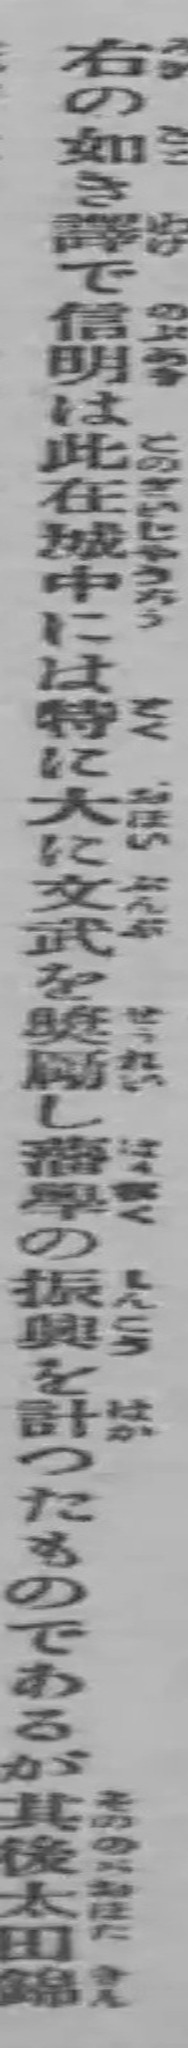右の如き訳で信明は此在城中には特に大に文武を奨励し藩学の振興を計つたものであるが其後太田錦
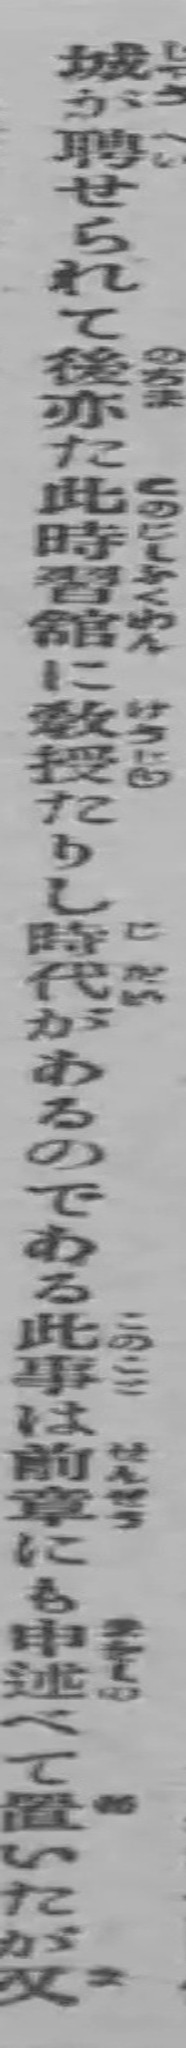城が聘せられて後亦た此時習館に教授たりし時代があるのである此事は前章にも申述べて置いたが又
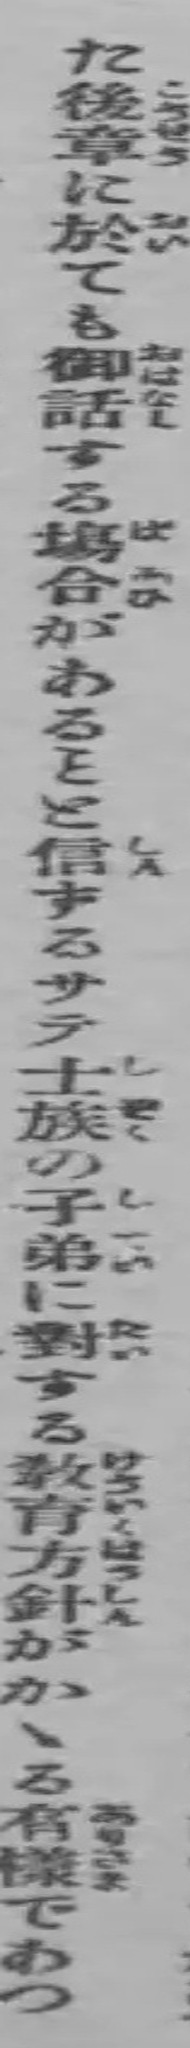た後章に於ても御話する場合があることと信ずるサテ士族の子弟に対する教育方針がかゝる有様であつ
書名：豊橋市史談
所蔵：国立国会図書館 National Diet Library, JAPAN
